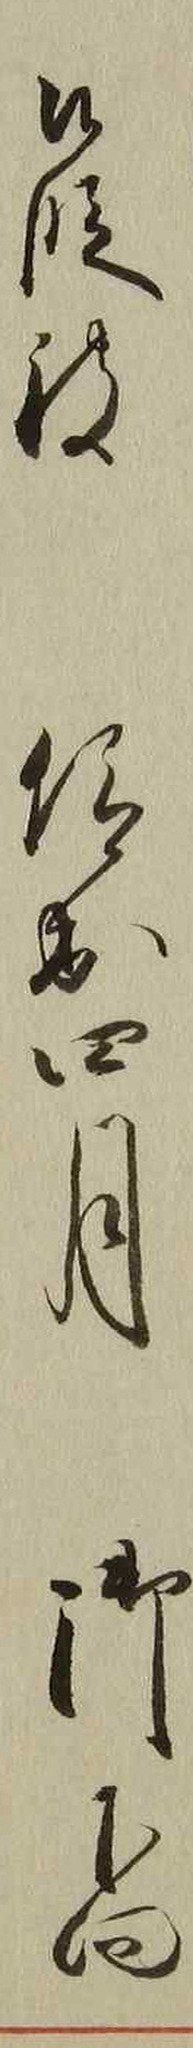候段被仰出四月御下向
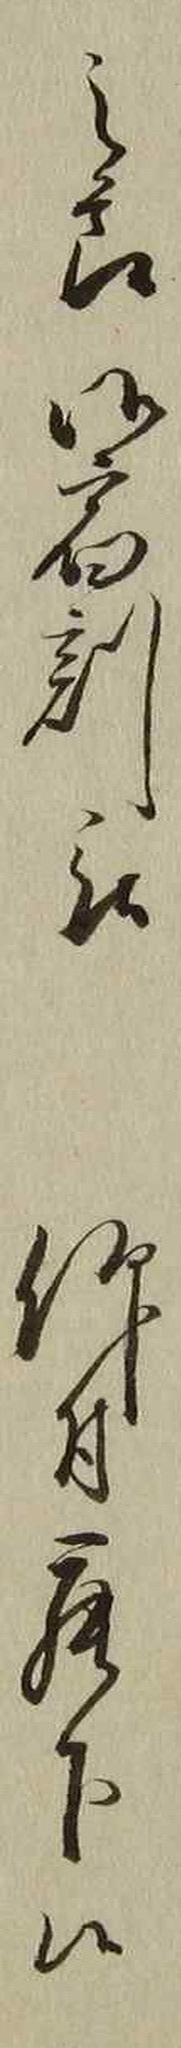之節御宿割被仰付罷下候
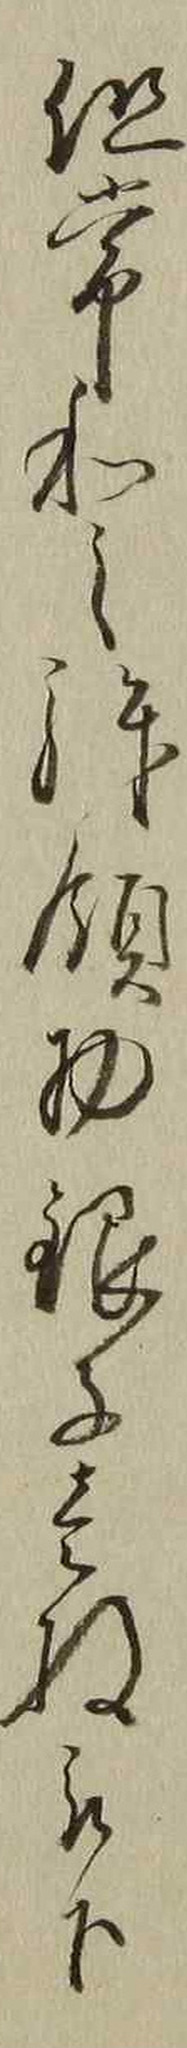但常和之拝領物銀子壱枚被下
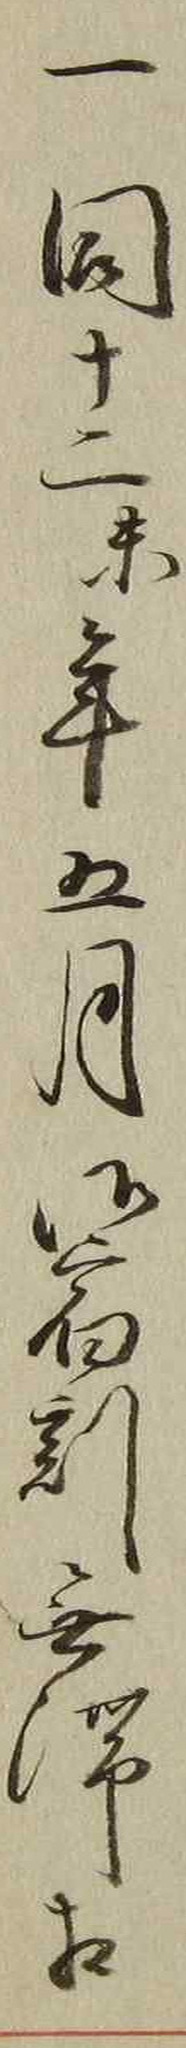一同十二未年五月御宿割無滞相
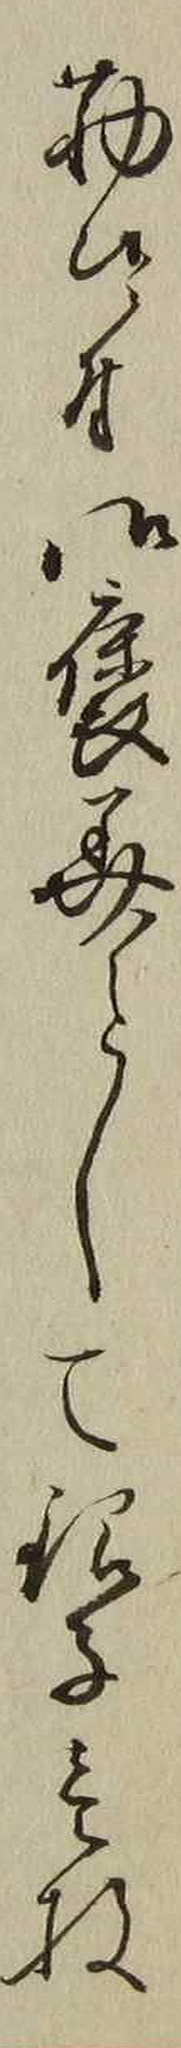勤候ニ付御褒美として銀子壱枚
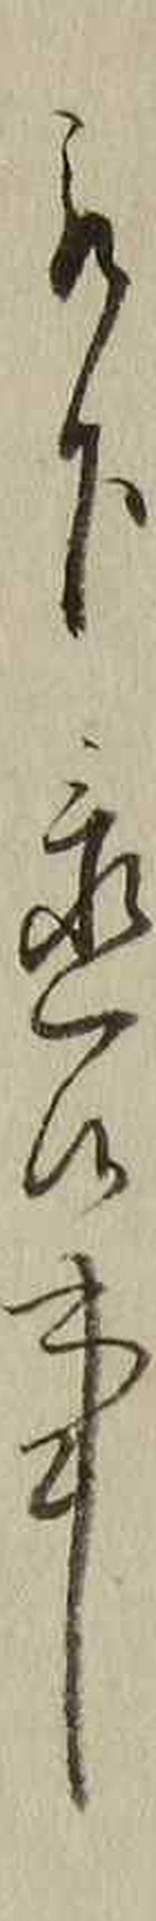被下置候事
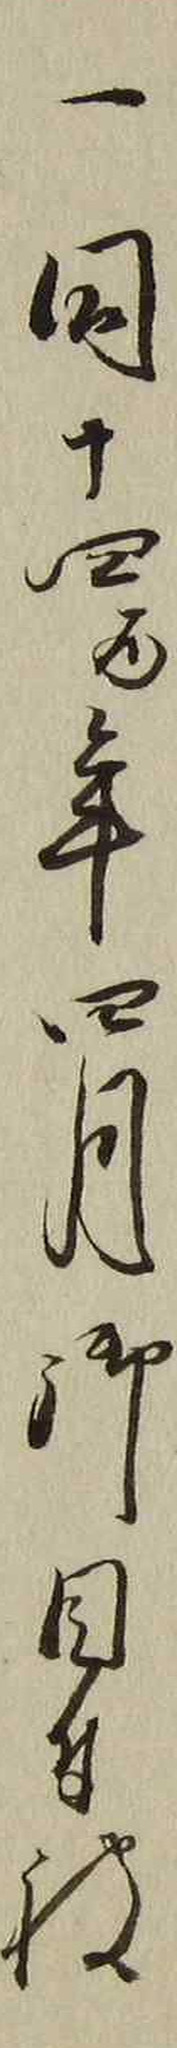一同十四酉年四月御目付被
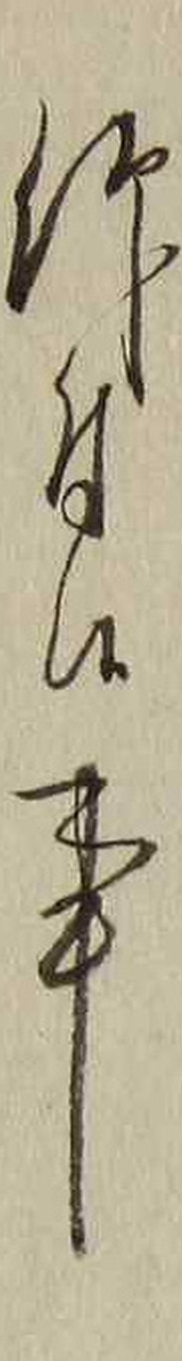仰付候事
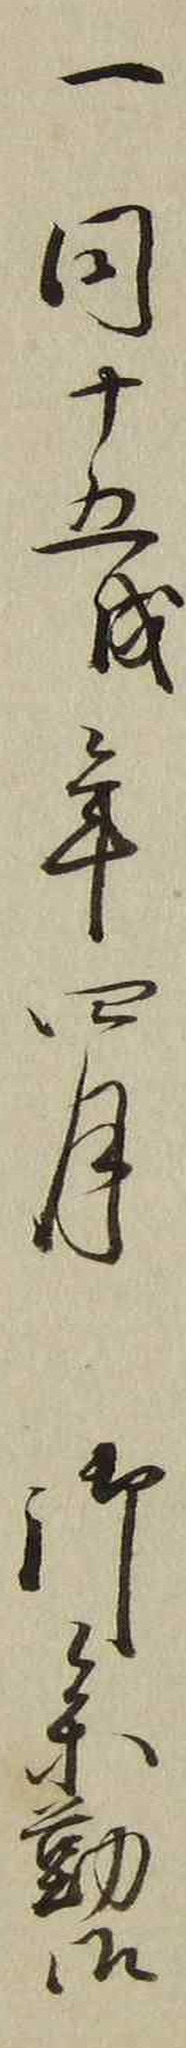一同十五戌年四月御参勤御
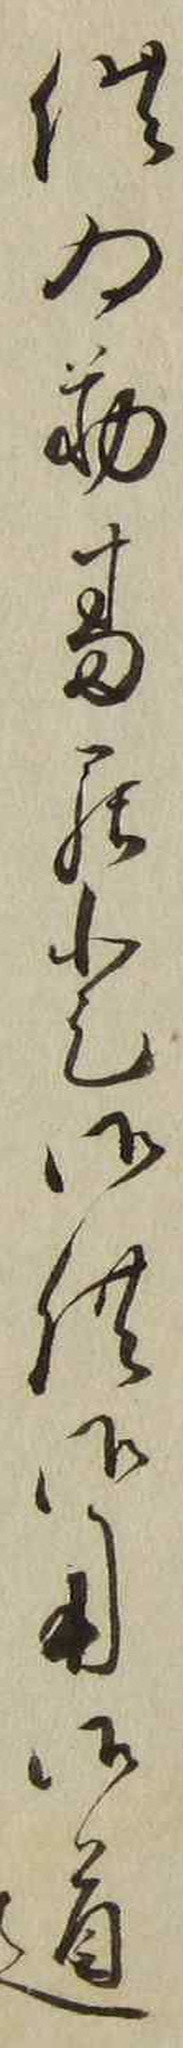供為勤番罷登御供御用御道

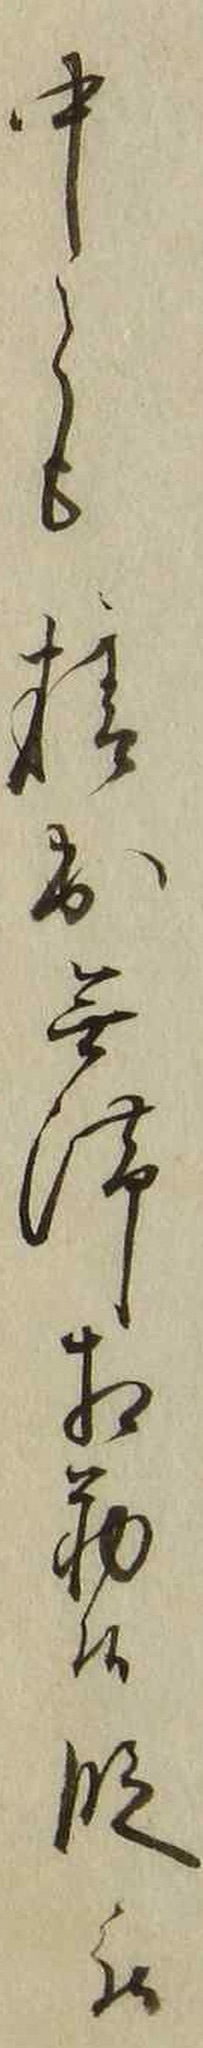中とも精出無滞相勤候段被
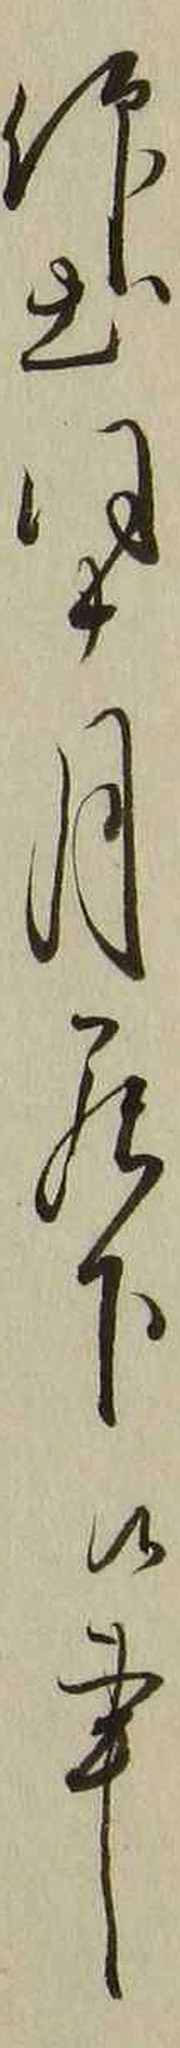仰出同十月罷下候事
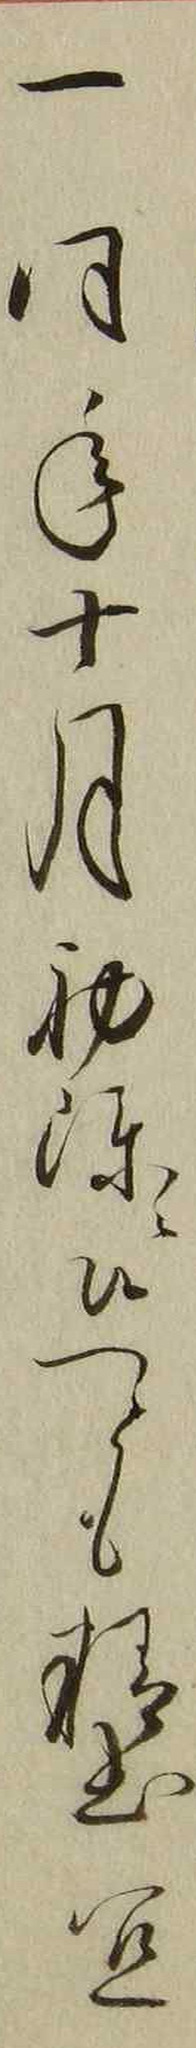一同年十月初陣ニ候へとも精出宜
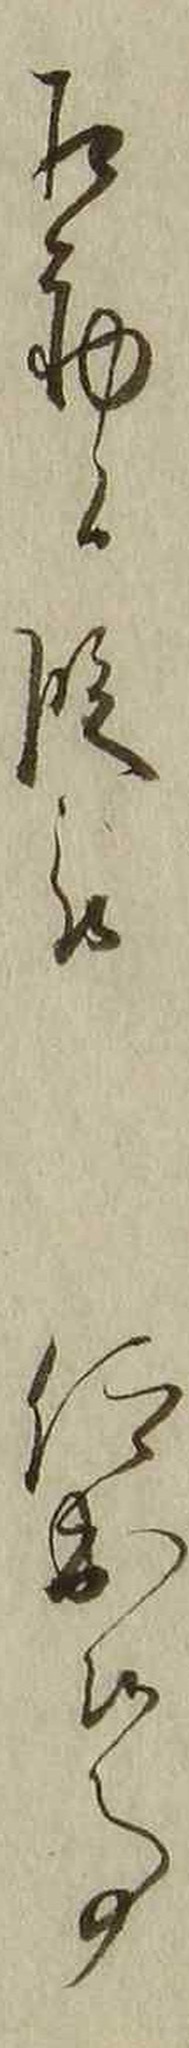相勤候段被仰出候事
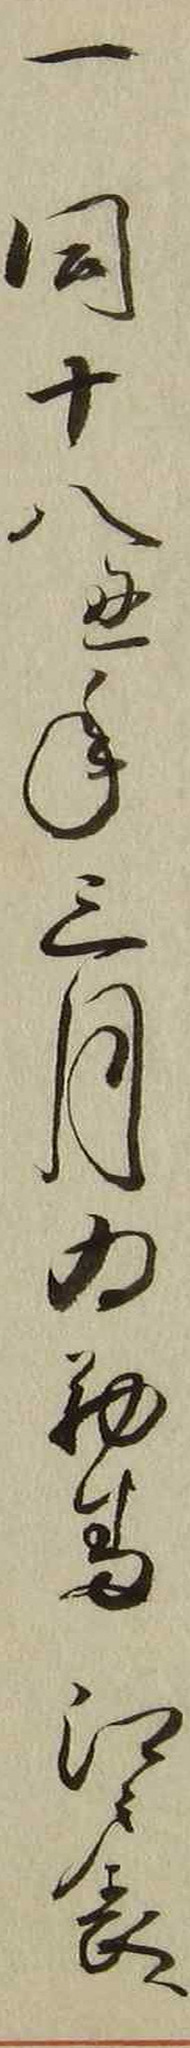一同十八丑年三月為勤番江戸表へ
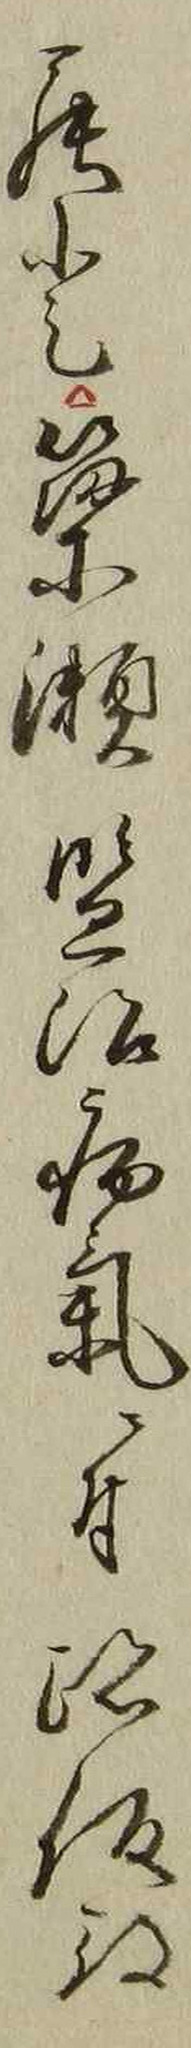罷登▵簗瀬監治病気ニ付跡仮頭
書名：諸士系譜　巻之2　い之部2
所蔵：会津若松市立会津図書館
